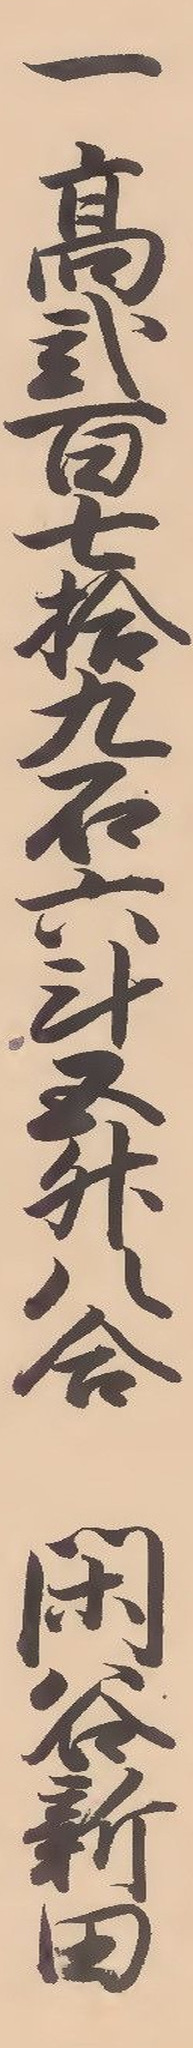一髙弐百七拾九石六斗五升八合閑谷新田

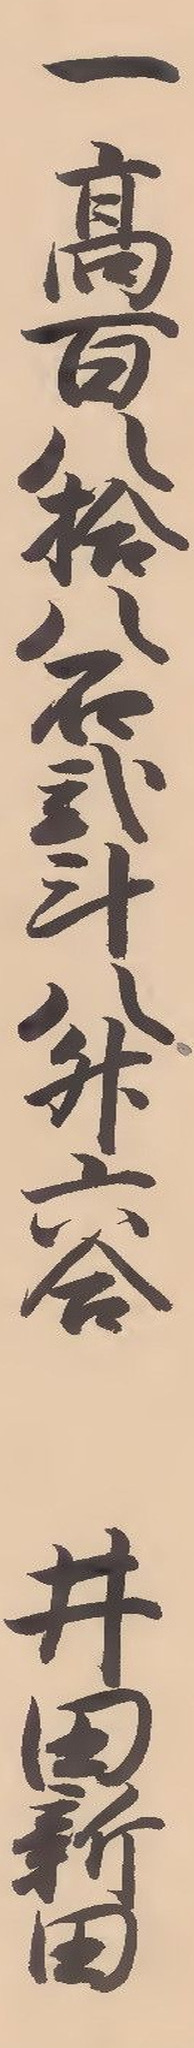一髙百八拾八石弐斗八升六合井田新田
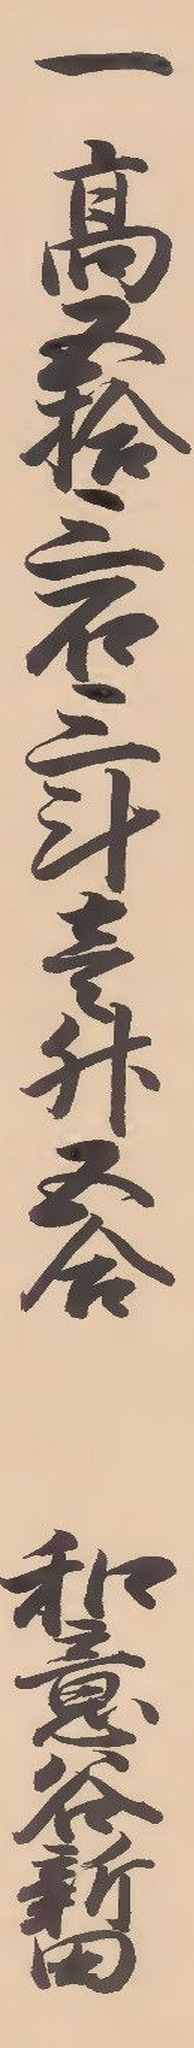一髙五拾三石三斗壱升五合和意谷新田
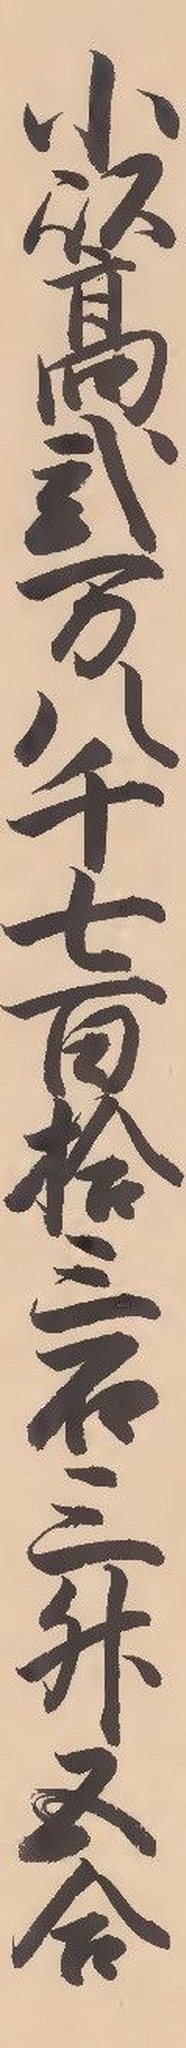小以髙弐万八千七百拾三石三升五合
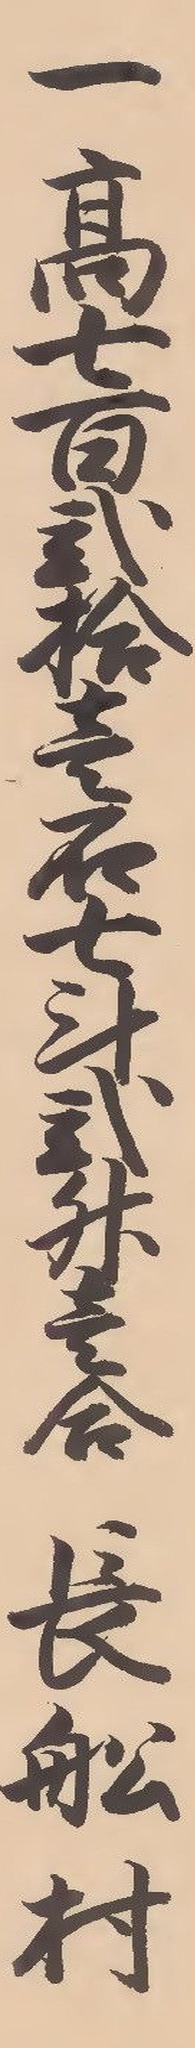一髙七百弐拾壱石七斗弐升壱合長舩村
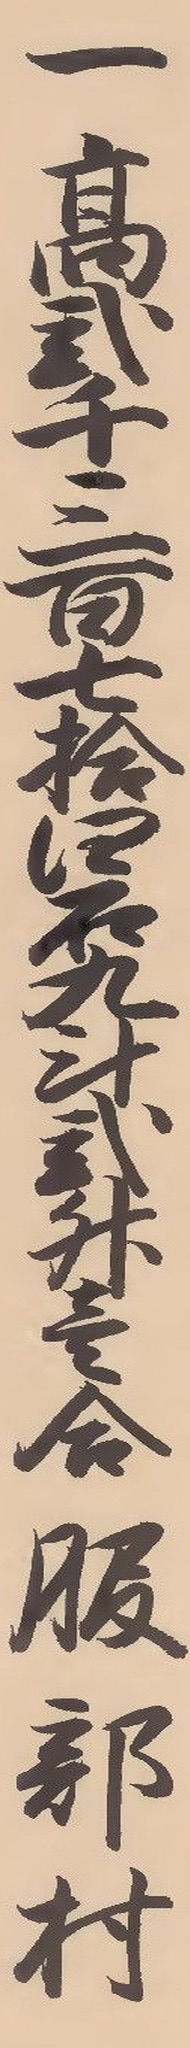一髙弐千三百七拾四石九斗弐升壱合服部村
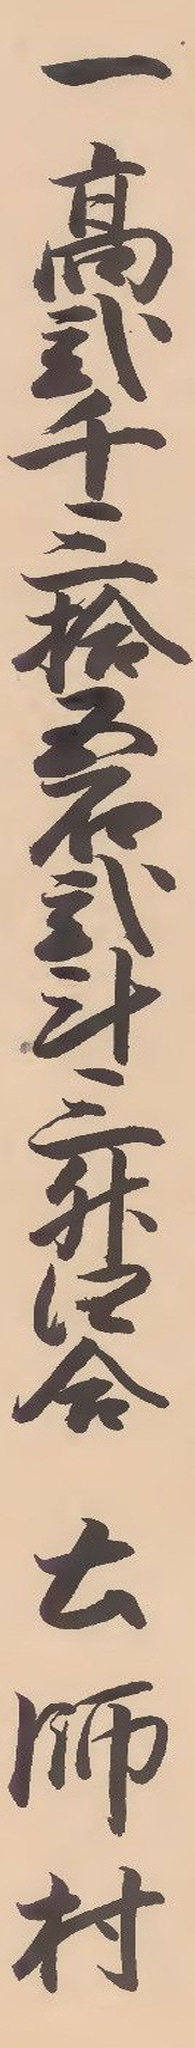一髙弐千三拾五石弐斗三升四合土師村

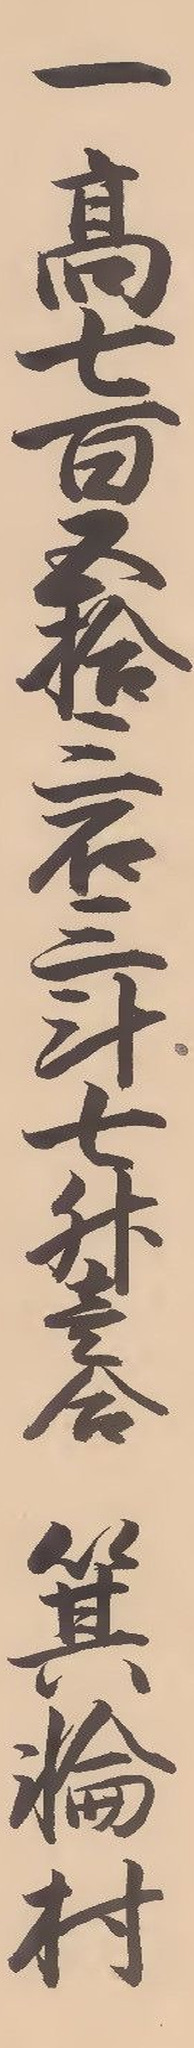一髙七百五拾三石三斗七升壱合箕輪村
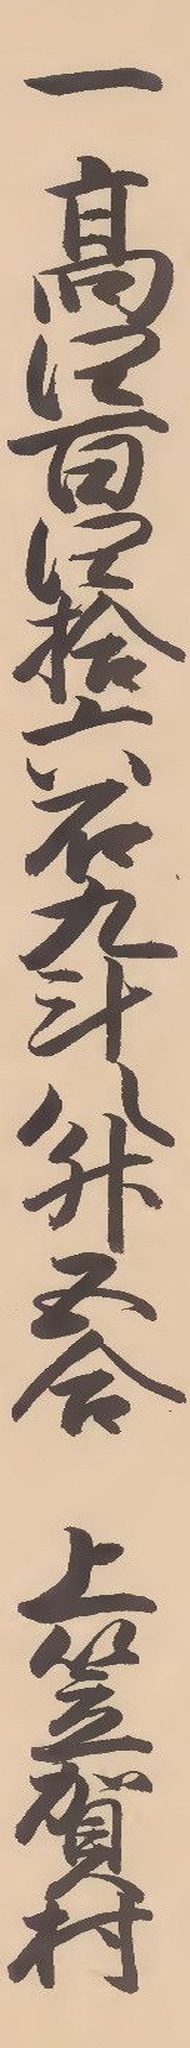一髙四百四拾六石九斗八升五合上笠賀村
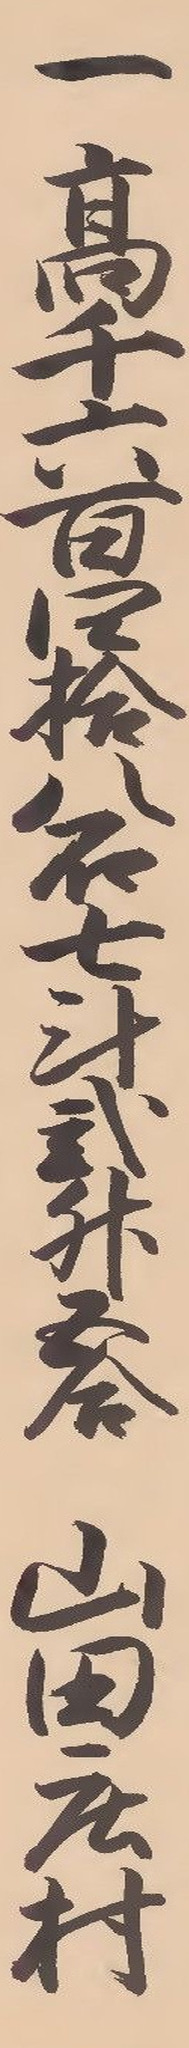一髙千六百四拾八石七斗弐升五合山田庄村
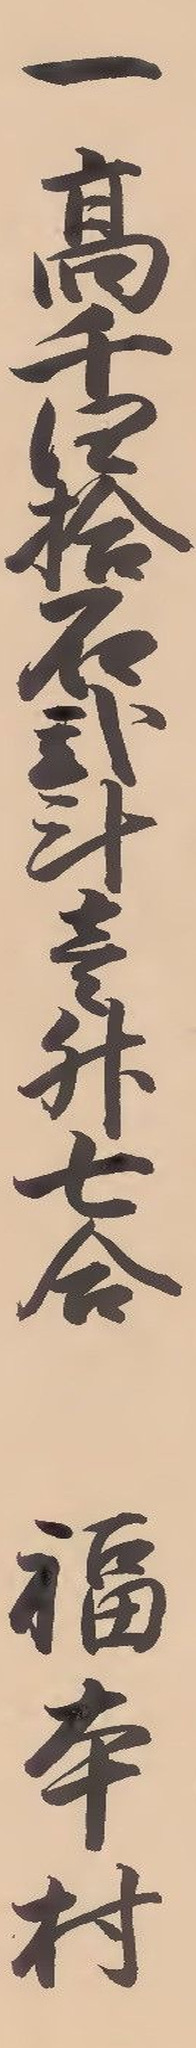一髙千四拾石弐斗壱升七合福本村
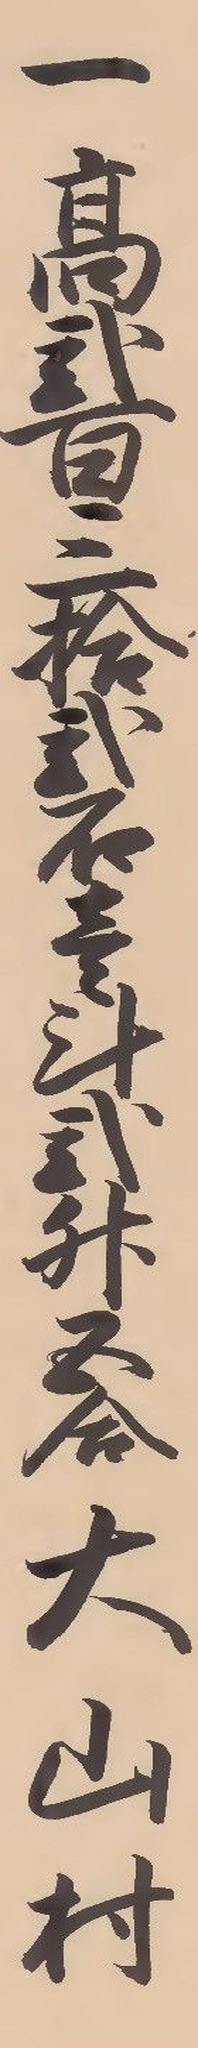一髙弐百三拾弐石壱斗弐升五合大山村
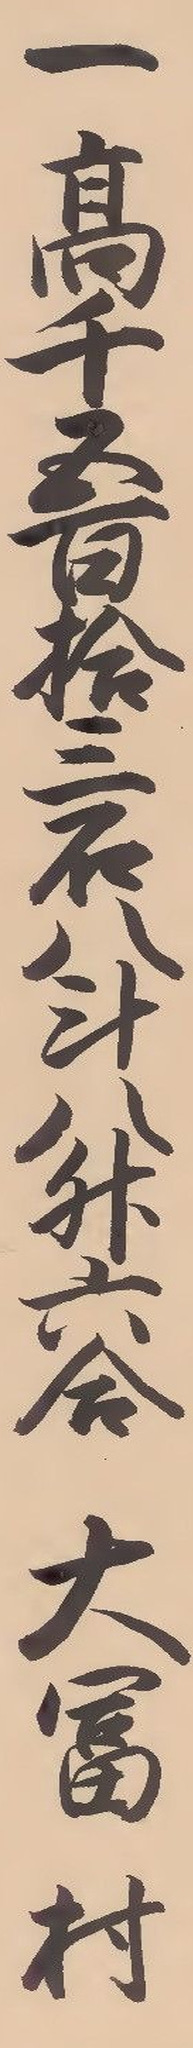一髙千五百拾三石八斗八升六合大冨村
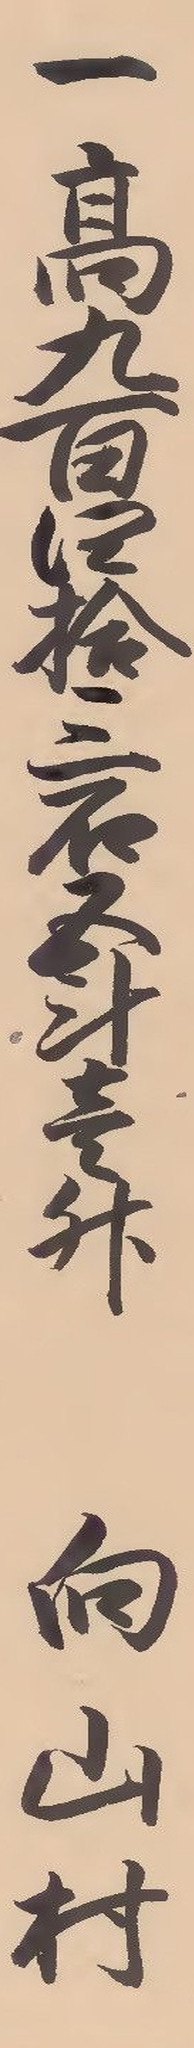一髙九百四拾三石五斗壱升向山村

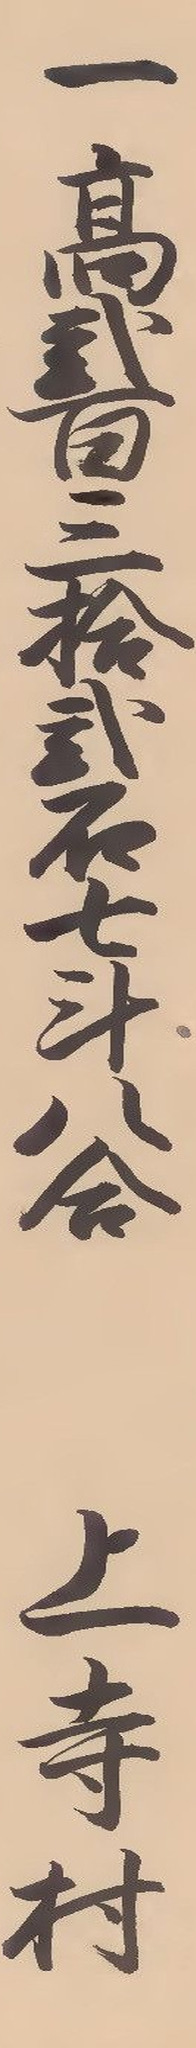一髙弐百三拾弐石七斗八合上寺村
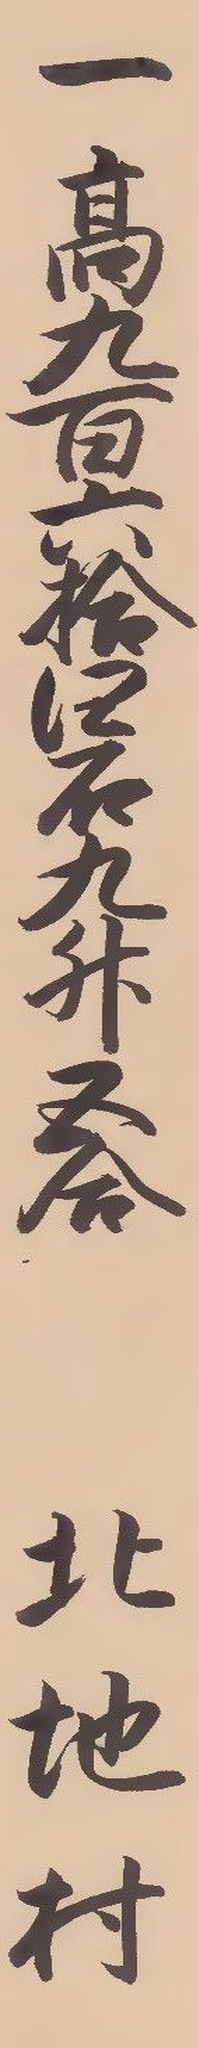一髙九百六拾四石九升五合北地村
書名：備前国郷帳
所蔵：国立公文書館 National Archives of Japan
